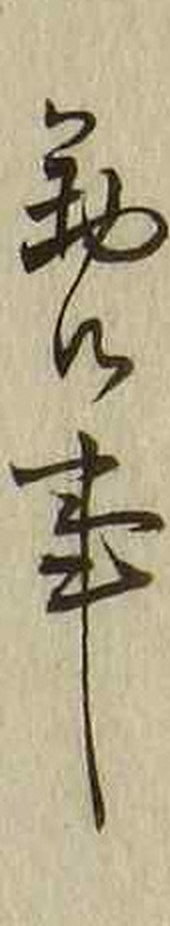勤候事
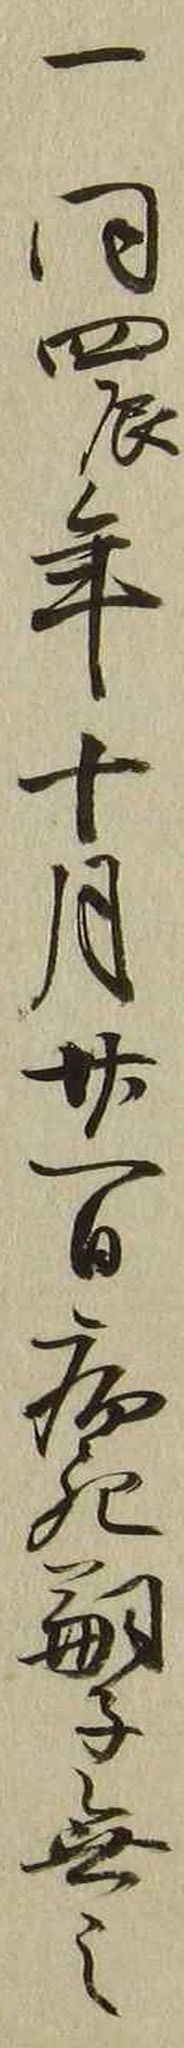一同四辰年十月廿一日病死嗣子無之
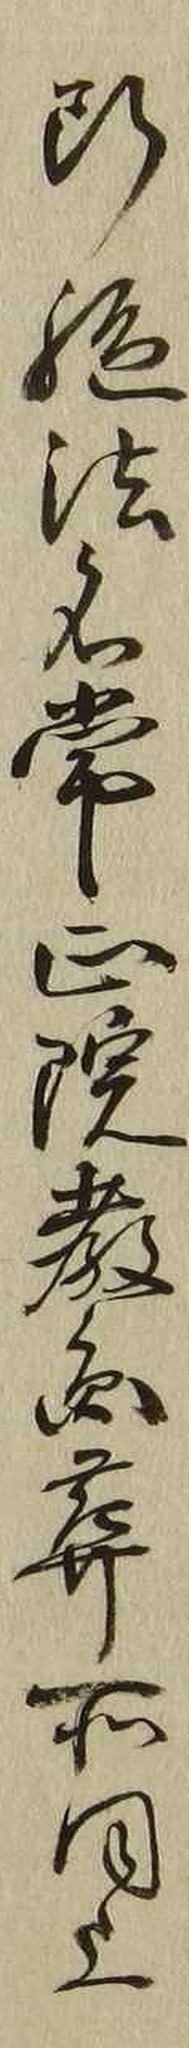断絶法名常正院教円葬所同上
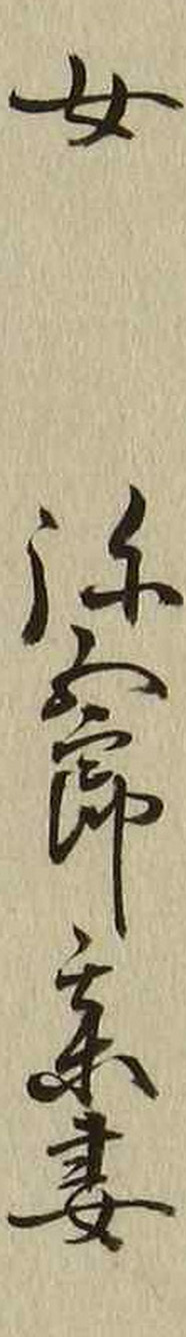女弥五郎某妻
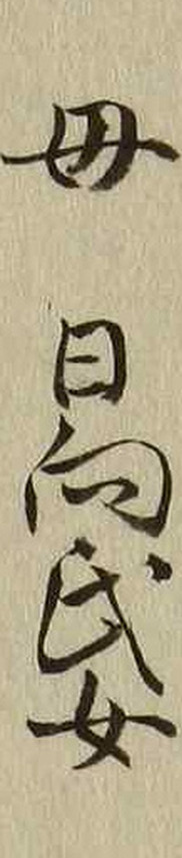母日向氏女
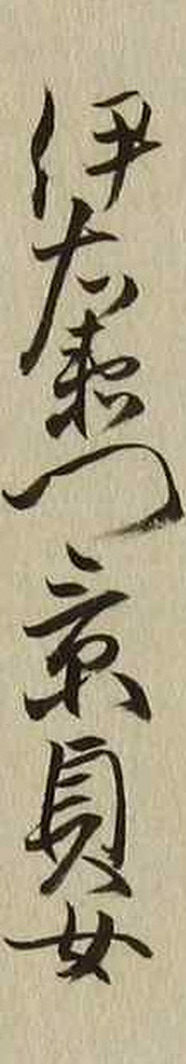母伊右衛門景貞女
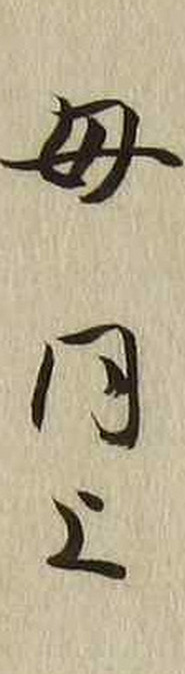母同上
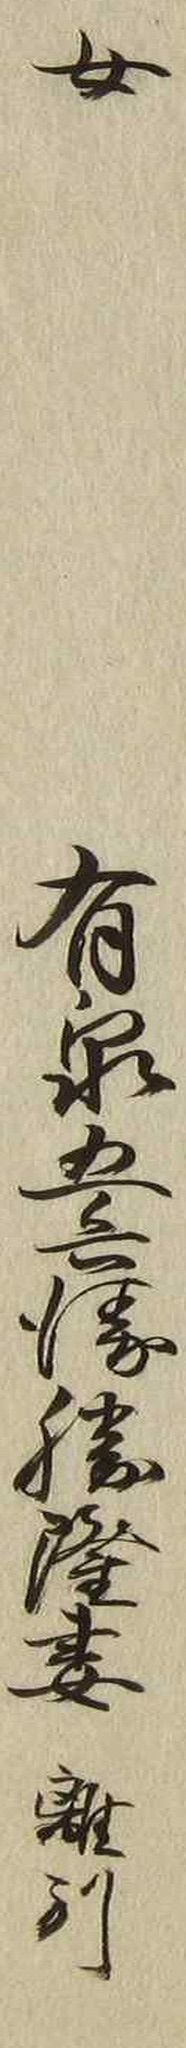女有泉五兵衛勝隆妻離別
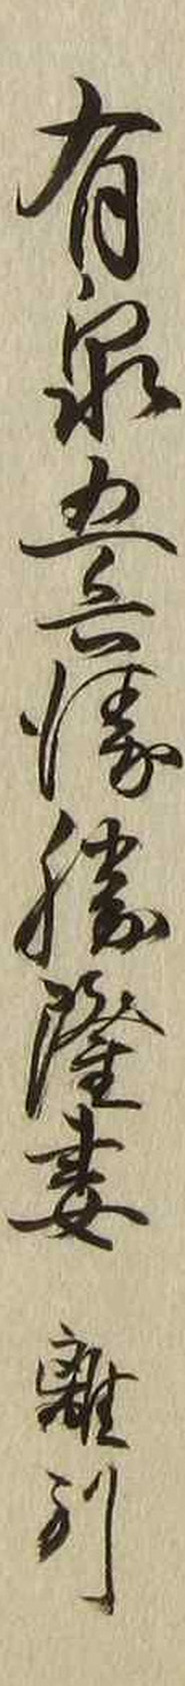女有泉五兵衛勝隆妻離別
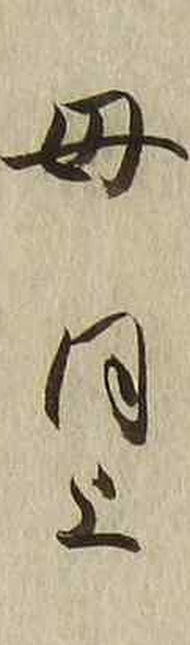母同上

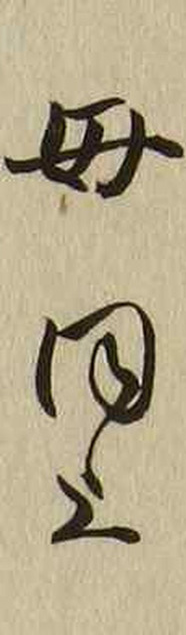母同上
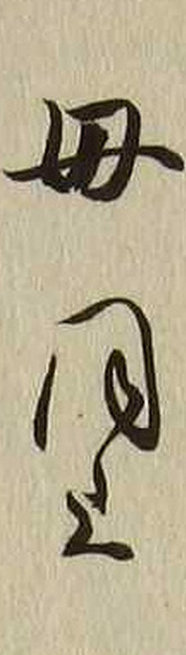母同上
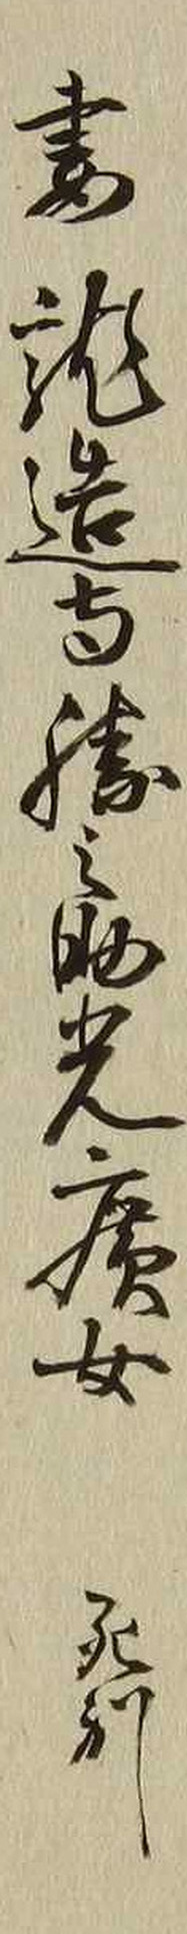妻龍造寺勝之助光広女死別
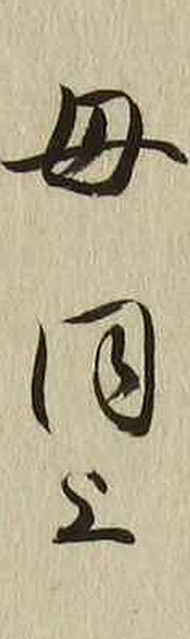母同上
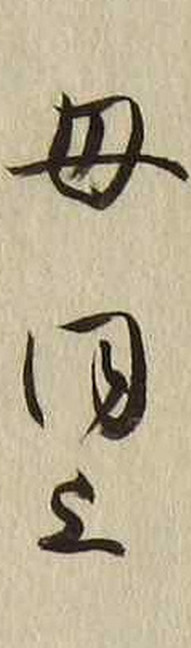母同上

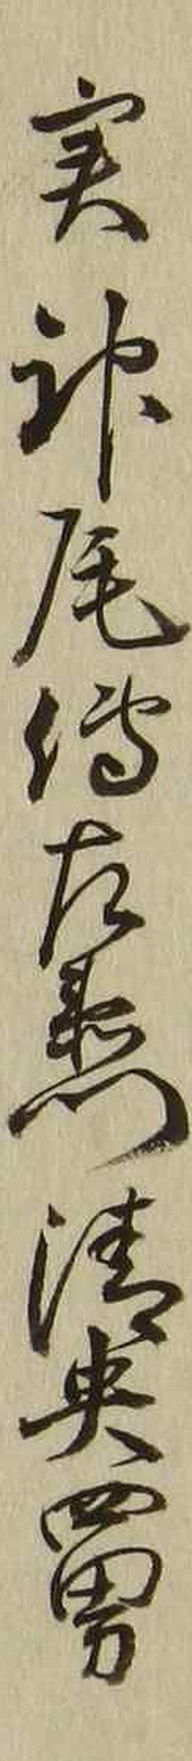実神尾伝左衛門清央四男
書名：諸士系譜　巻之60　と之部3
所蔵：会津若松市立会津図書館
